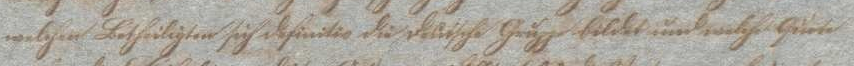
welchen Betheiligten sich definitiv die deutsche Gruppe bildet und welche Quote
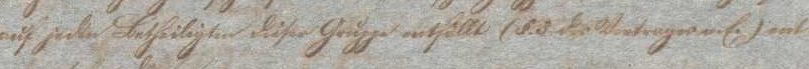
auf jeden Betheiligten dieser Gruppe entfällt (§. 3 des Vertrages a. E.) ent-
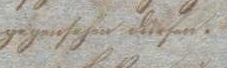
gegensehen dürfen.
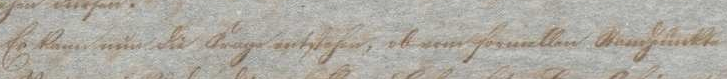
Es kann nun die Frage entsprechen, ob vom formellen Standpunkte
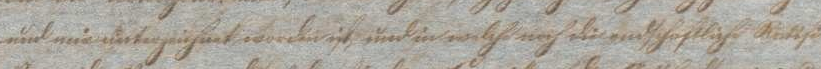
und mir unterzeichnet worden ist, und in welche noch die endschaftliche Ratifi-
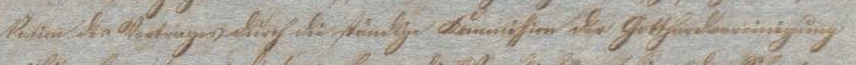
kation des Vertrages durch die ständige Kommission der Gotthardvereinigung
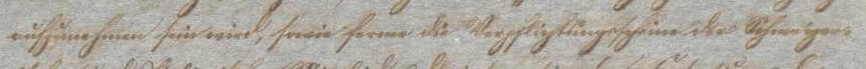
aufzunehmen sein wird, sowie ferner die Verpflichtungsscheine der Schweizer-
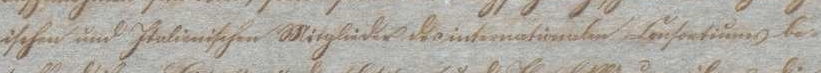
ischen und Italienischen Mitglieder des internationalen Consortiums be-
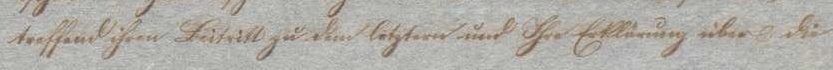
treffend ihren Beitritt zu dem letzern und Ihre Erklärung über die
